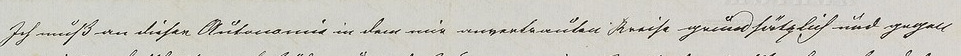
Ich muß an dieser Autonomie in dem mir anvertrauten Kreise grundsätzlich und gegen
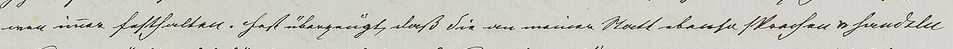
wen immer festhalten. Fest überzeugt, daß Sie an meiner Statt ebenso sprechen & handeln
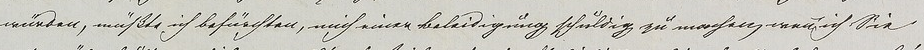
würden, müßte ich befürchten, mich einer Beleidigung schuldig zu machen, wenn ich Sie
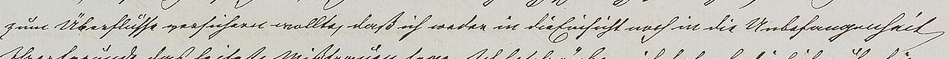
zum Überflusse versichern wollte, daß ich weder in die Einsicht noch in die Unbefangenheit
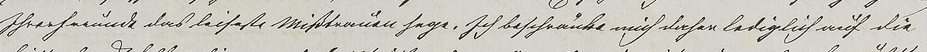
Ihrer Freunde das leiseste Mißtrauen hege. Ich beschränke mich daher lediglich auf die
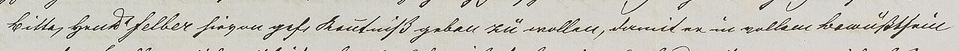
Bitte, Hrn DrFelber hievon gef. Kenntniß geben zu wollen, damit er in vollem Bewußtsein
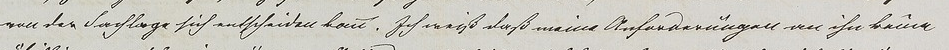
von der Sachlage sich entscheiden kann. Ich weiß daß meine Anforderungen an ihn keine
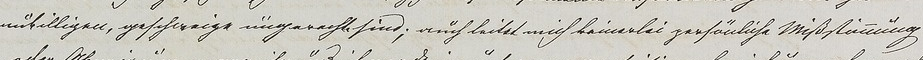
unbilligen, geschweige ungerechte sind; auch leitet mich keinerlei persönliche Mißstimmung
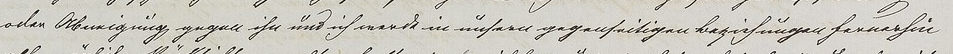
oder Abneigung gegen ihn und ich werde in unsern gegenseitigen Beziehungen fernerhin
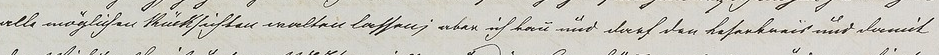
alle möglichen Rücksichten walten lassen; aber ich kann und darf Lesekreis und damit
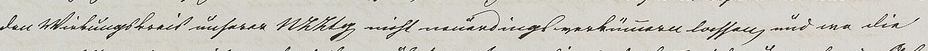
den Wirkungskreis unserer NZZtg nicht neuerdings verkümmern lassen, und wo die
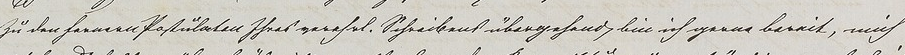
Zu den fernern Postulaten Ihres verehrl. Schreibens übergehend, bin ich gerne bereit, mich
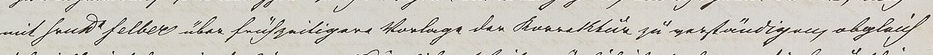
mit Hrn DrFelber über frühzeitigere Vorlage der Korrektur zu verständigen, obgleich
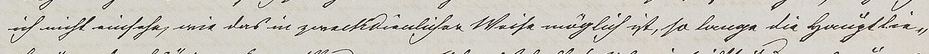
ich nicht einsehe, wie das in zweckdienlicher Weise möglich ist, so lange die Hauptlie-
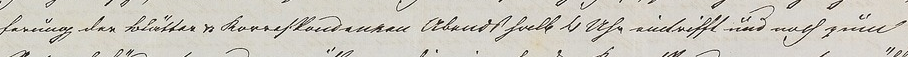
ferung der Blätter & Korrespondenzen Abends halb 4 Uhr eintrifft und noch zum
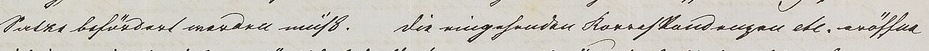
Satze befördert werden muß. Die eingehenden Korrespondenzen etc. eröffne
